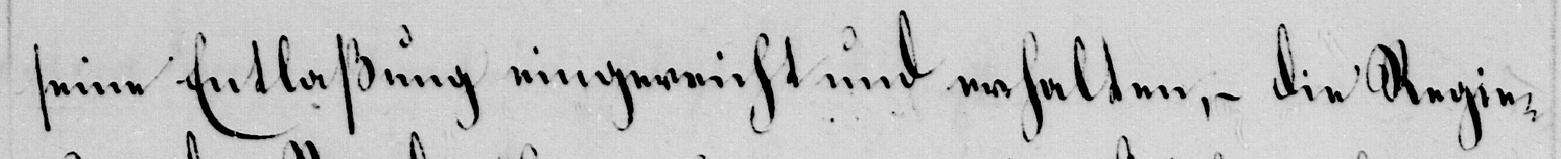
seine Entlaßung eingereicht und erhalten, – die Regie¬
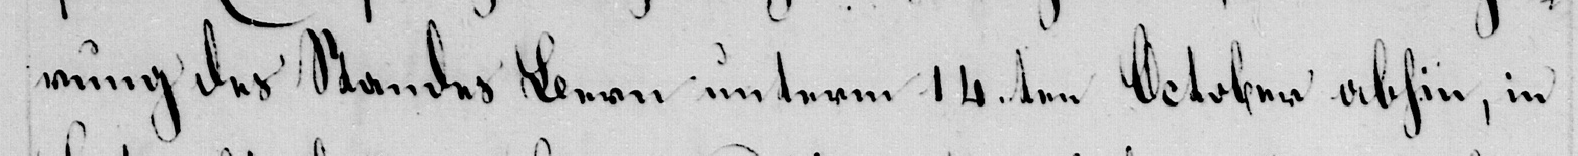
rung des Standes Bern unterm 14ten October abhin, in
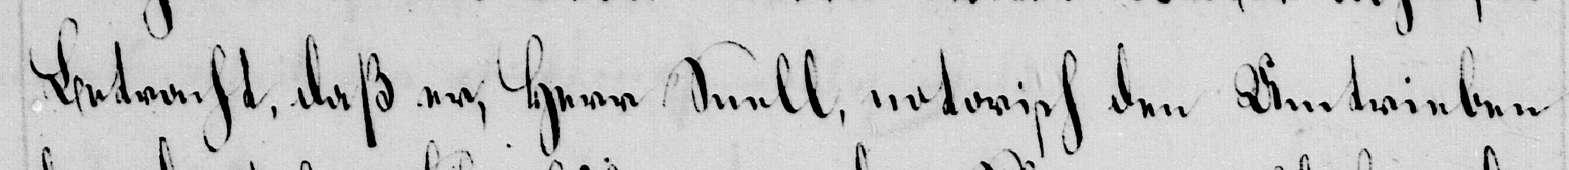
Betracht, daß er, Herr Snell, notorisch den Umtrieben
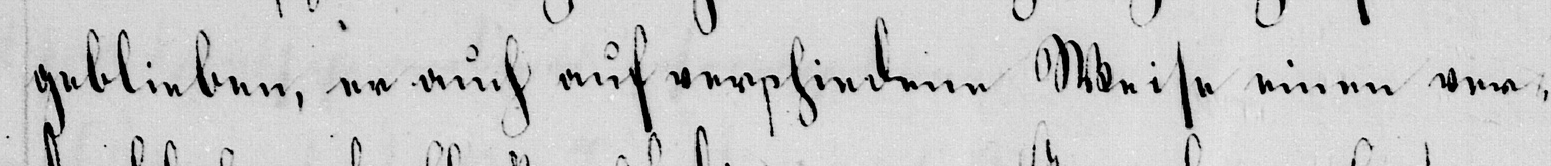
geblieben, er auch auf verschiedene Weise einen ver¬
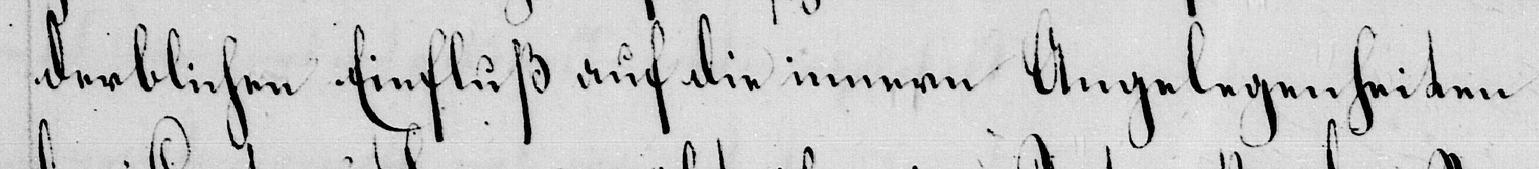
derblichen Einfluß auf die innern Angelegenheiten
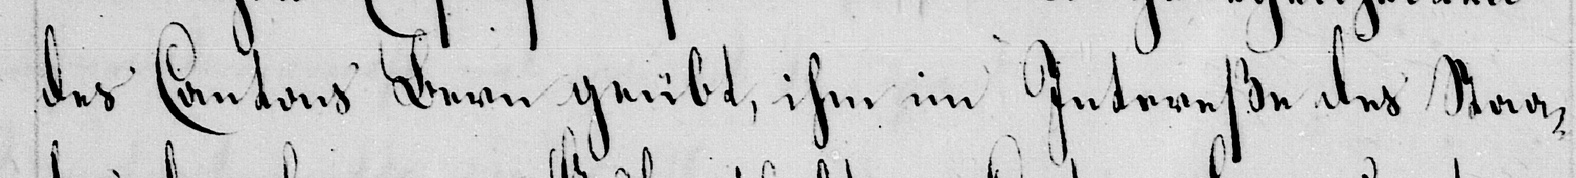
des Cantons Bern geübt, ihm im Intereße des Staa¬
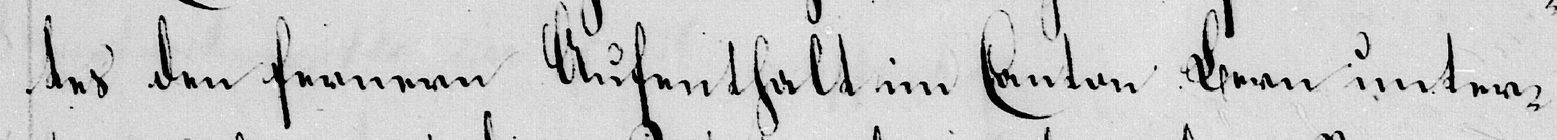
tes den fernern Aufenthalt im Canton Bern unter¬
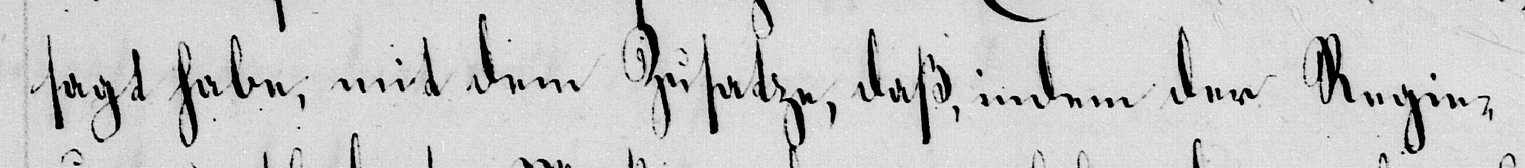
sagt habe, mit dem Zusatze, daß, indem der Regie¬
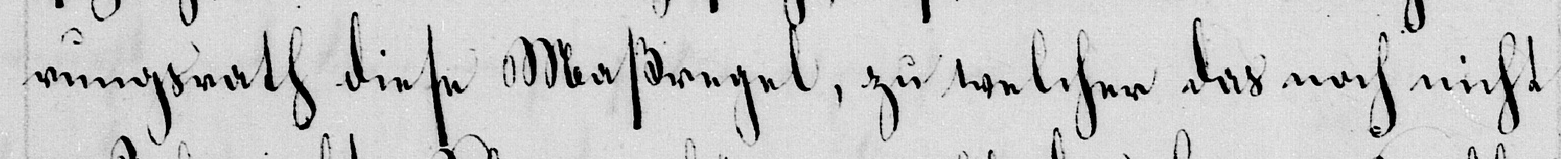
rungsrath diese Maßregel, zu welcher das noch nicht
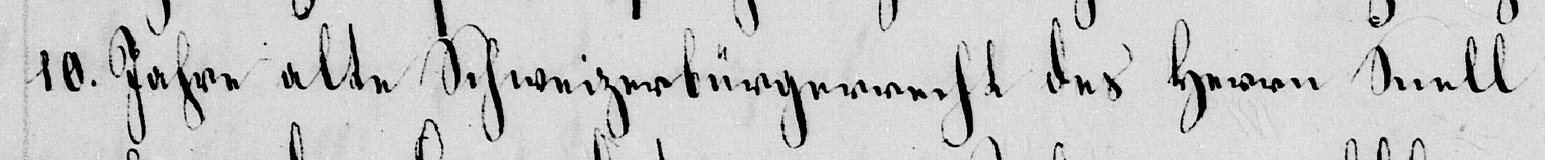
10. Jahre alte Schweizerbürgerrecht des Herrn Snell
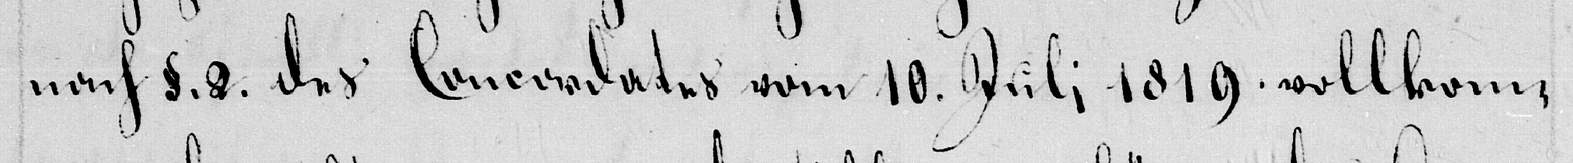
nach §. 2. des Concordates vom 10. Juli 1819. vollkom¬
